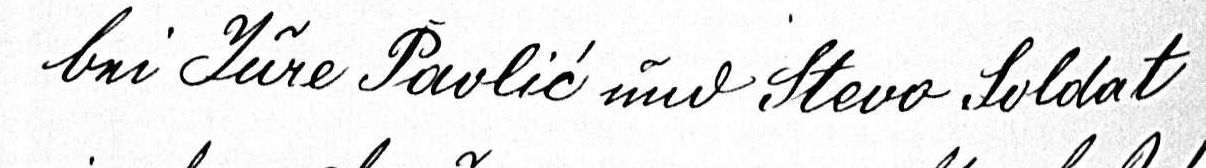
bei Jure Pavlić und Stevo Soldat
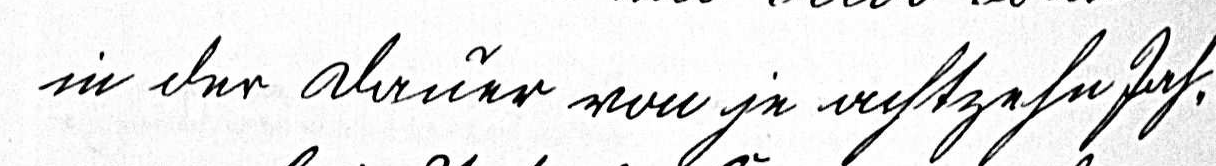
in der Dauer von je achtzehn Jah¬
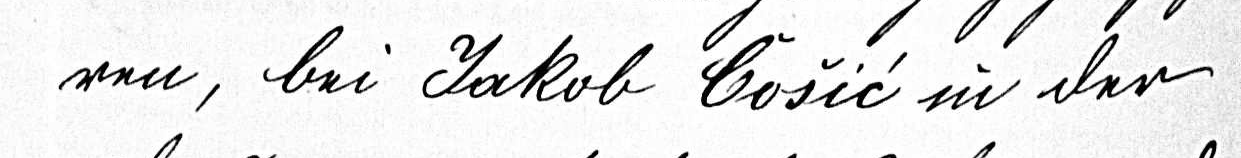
ren, bei Jakob Čošić in der
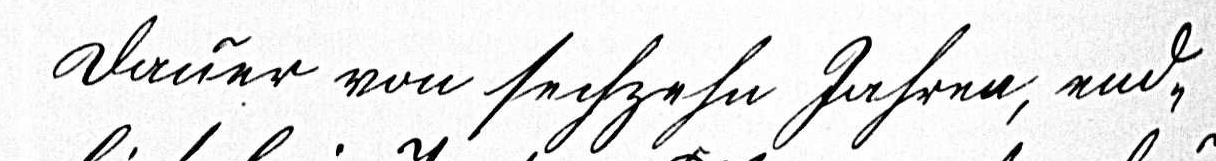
Dauer von sechzehn Jahren und
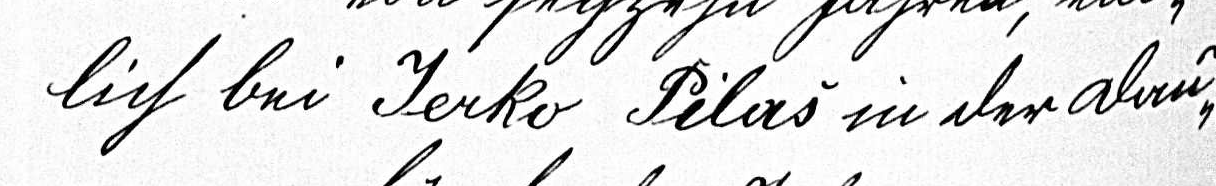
bei Jerko Pilaš in der Dau¬
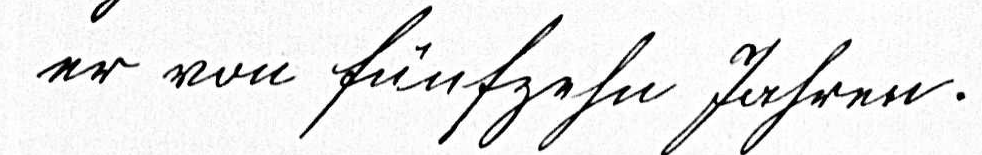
er von fünfzehn Jahren.
